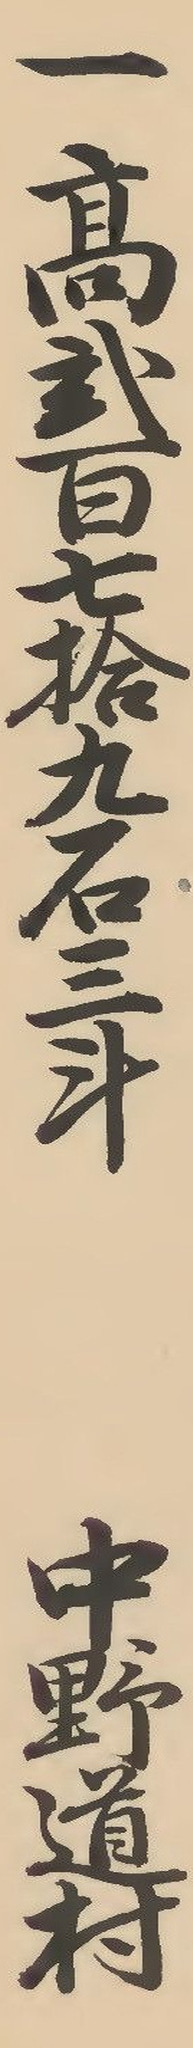一高弐百七拾九石三斗中野道村

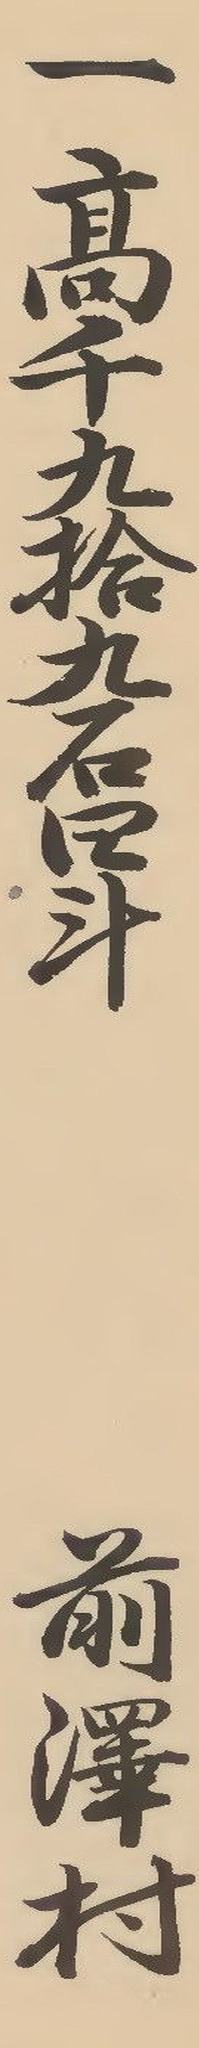一高千九拾九石四斗前沢村
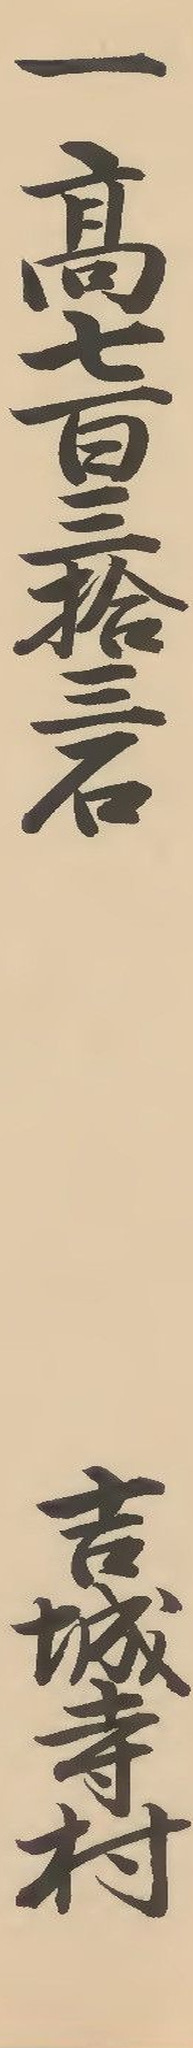一高七百三拾三石吉城寺村
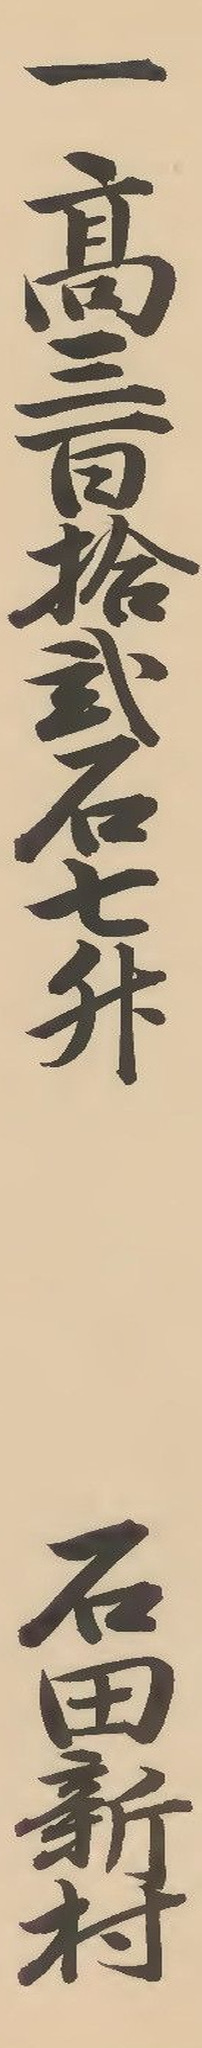一高三百拾弐石七升石田新村
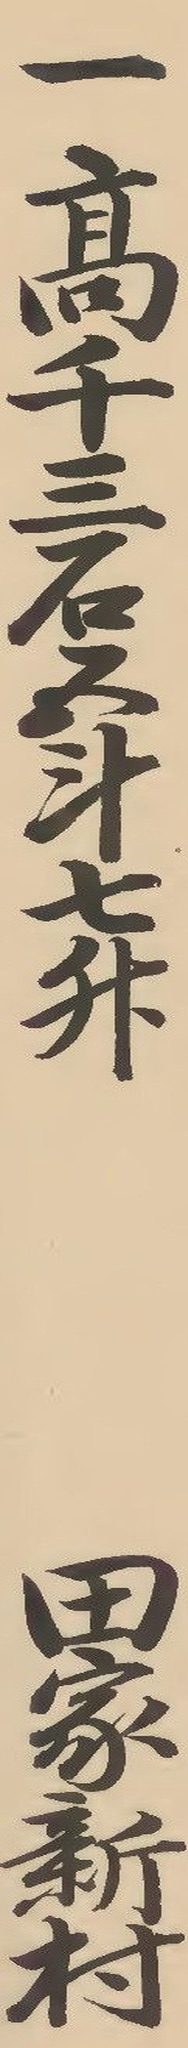一高千三石五斗七升田家新村
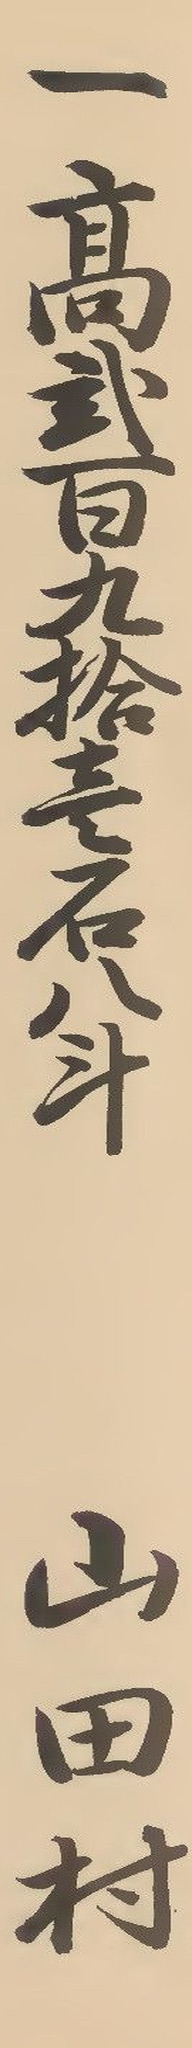一高弐百九拾壱石八斗山田村
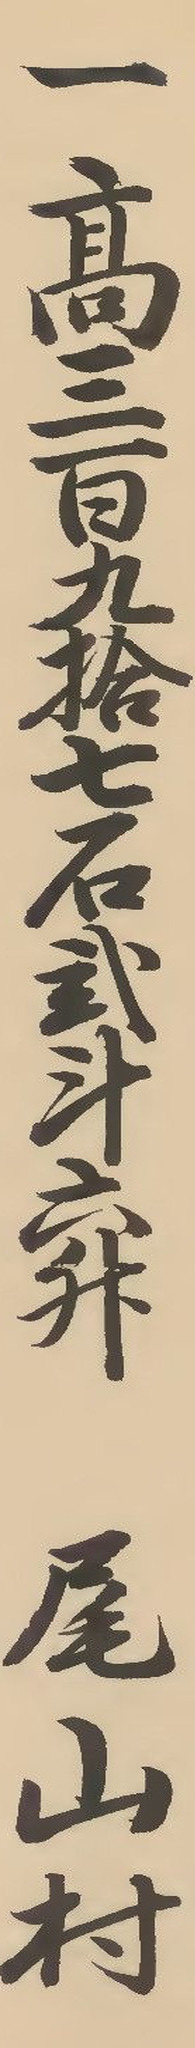一高三百九拾七石弐斗六升尾山村
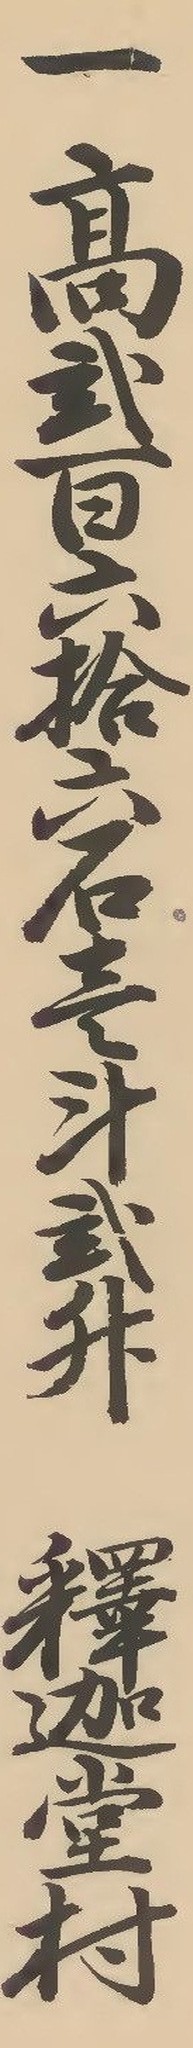一高弐百六拾六石壱斗弐升釈迦堂村

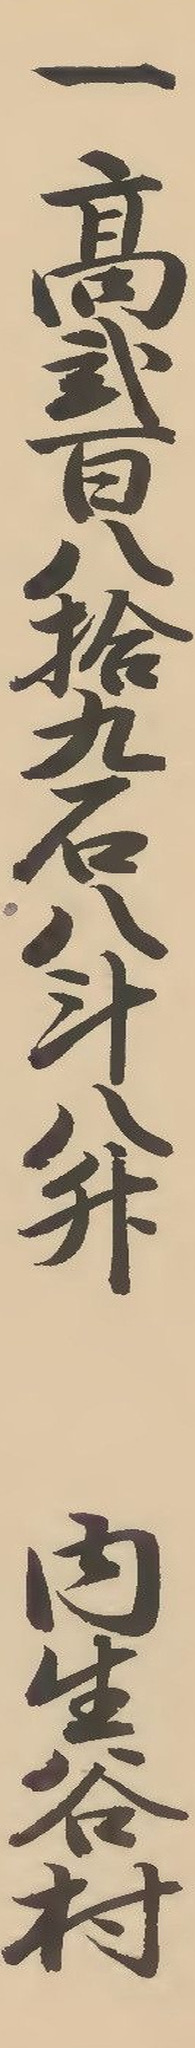一高弐百八拾九石八斗八升内生谷村
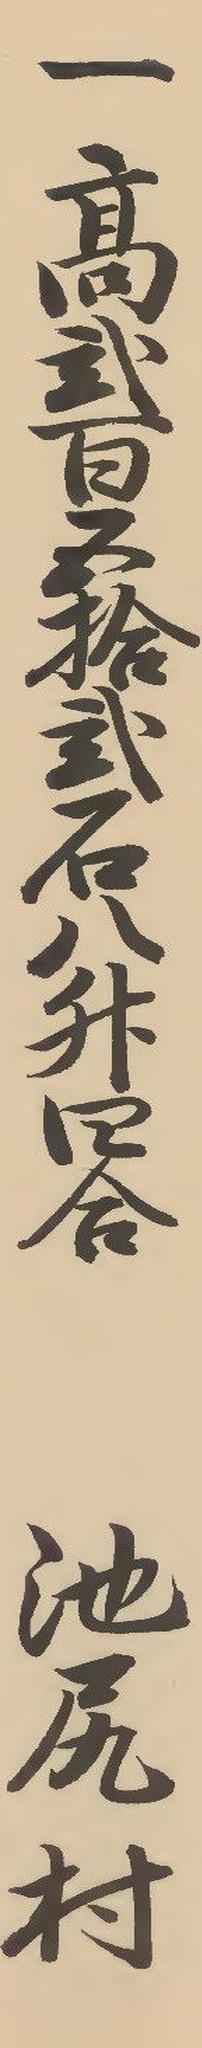一高弐百五拾弐石八升四合池尻村
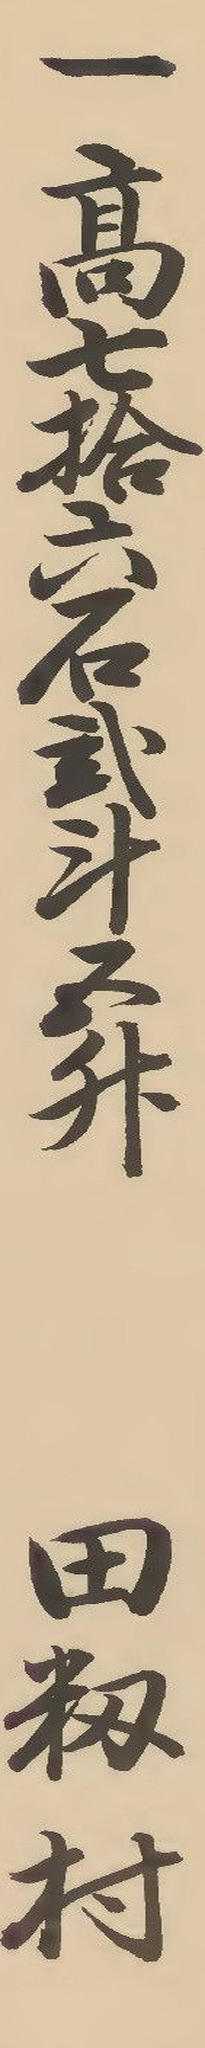一高七拾六石弐斗五升田籾村
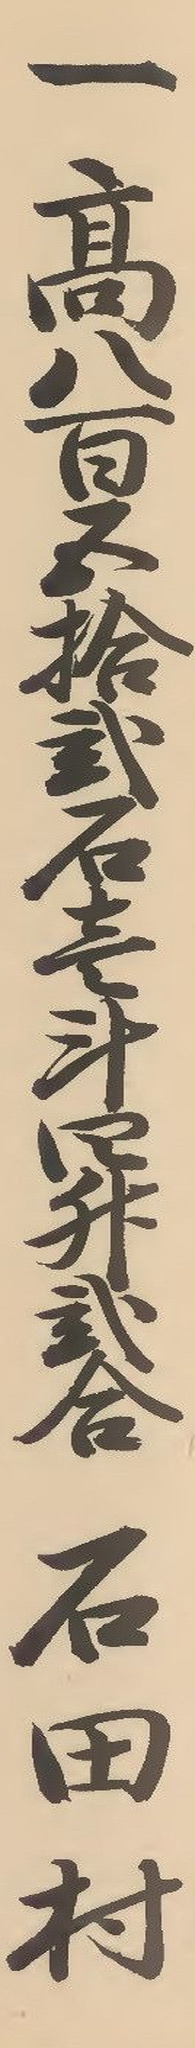一高八百五拾弐石壱斗四升弐合石田村
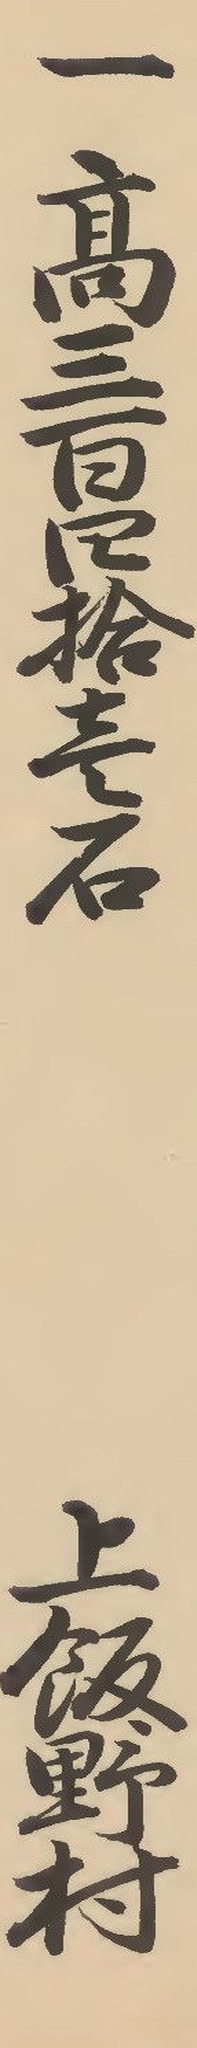一高三百四拾壱石上飯野村
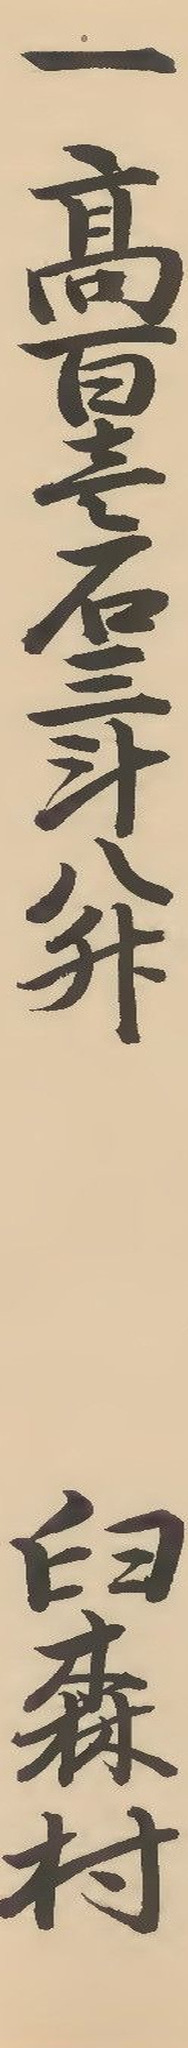一高百壱石三斗八升臼森村

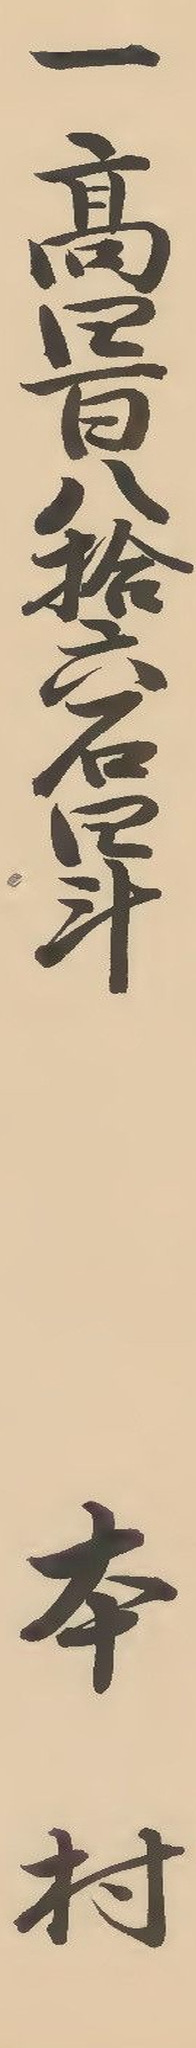一高四百八拾六石四斗本村
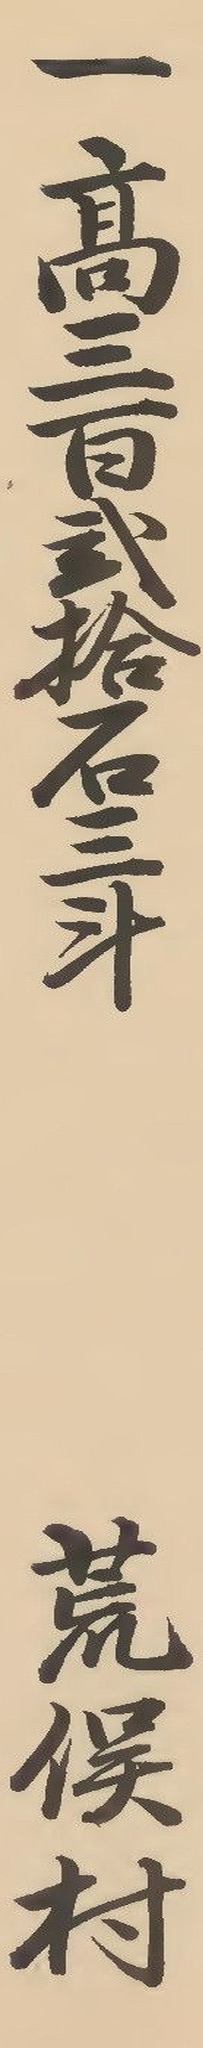一高三百弐拾石三斗荒俣村
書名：越中国郷帳
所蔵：国立公文書館 National Archives of Japan
